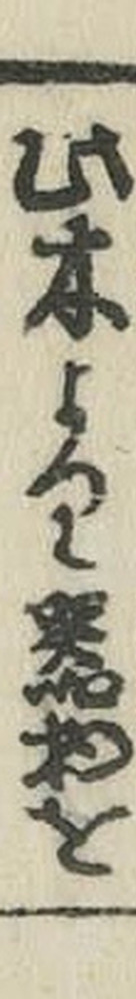此木より器物を
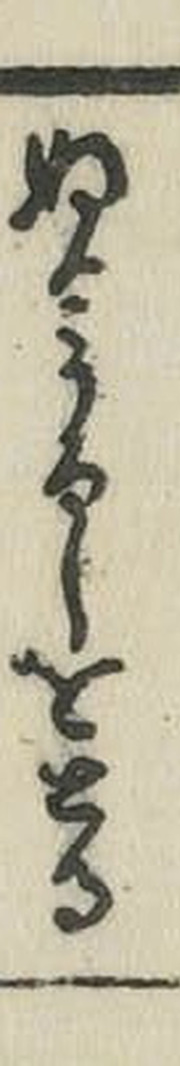ぬるうるしをとる
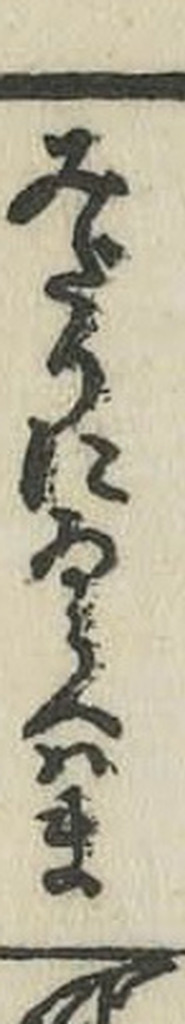みだりにゐらへはま
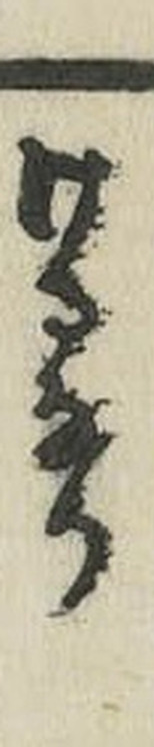けるなり
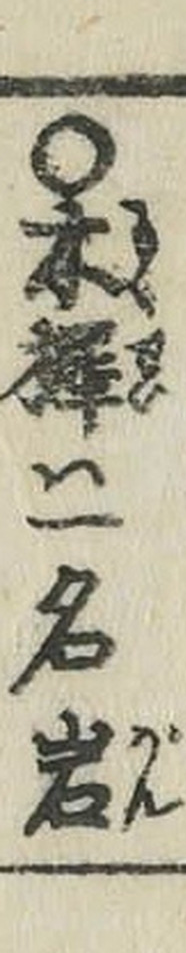○木樨は一名岩
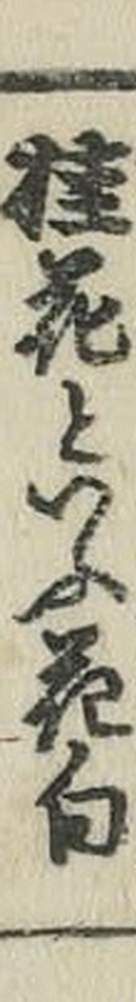桂花といふ花白
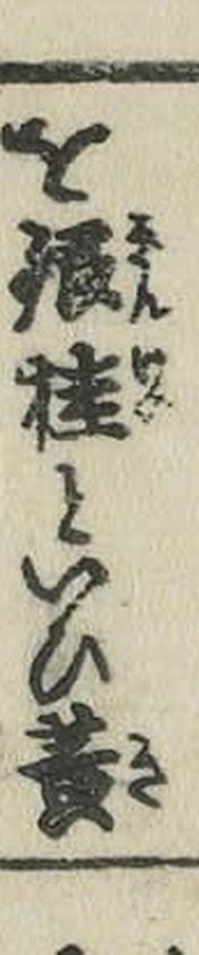を銀桂といひ黄
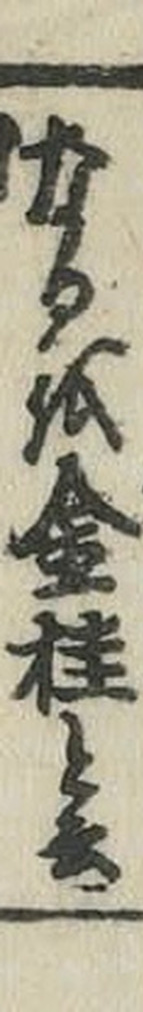なるを金桂と云

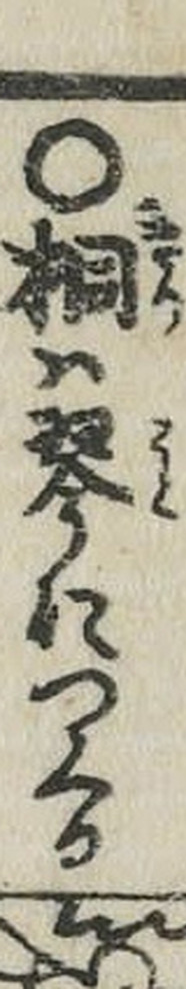○桐は琴につくる
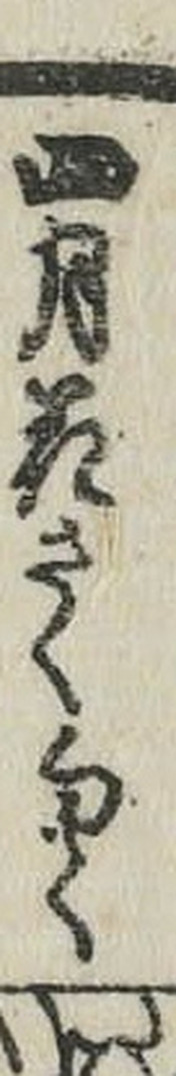四月花さく白く
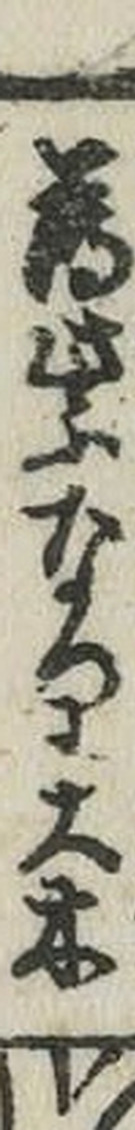薄紫なり大木
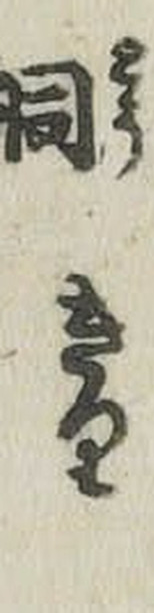桐きり
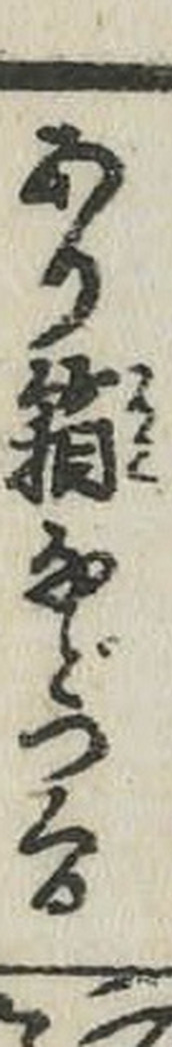あり箱などつくる
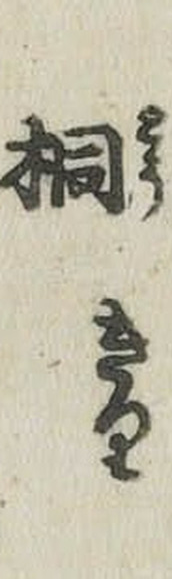桐きり
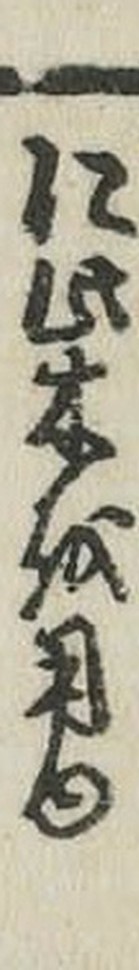に此木を用ゆ
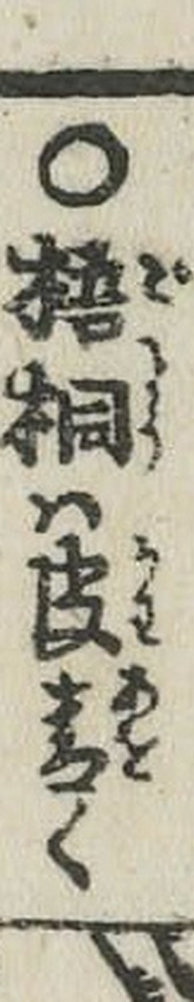○梧桐は皮青く
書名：増補頭書訓蒙図彙大成 10巻 8:巻之17-19
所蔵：東京学芸大学教育コンテンツアーカイブ
